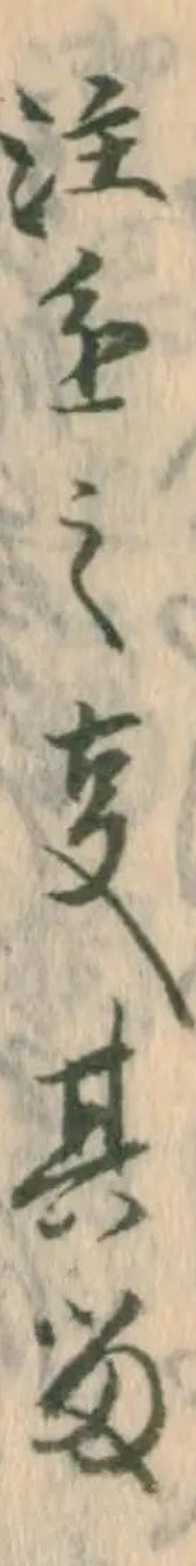注進之事其留
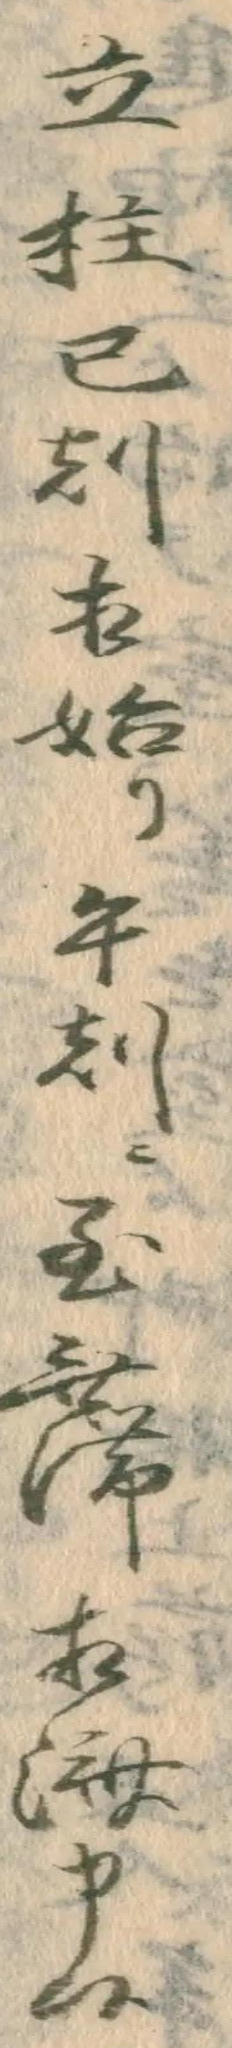立柱巳刻相始リ午刻ニ至無滞相済申候
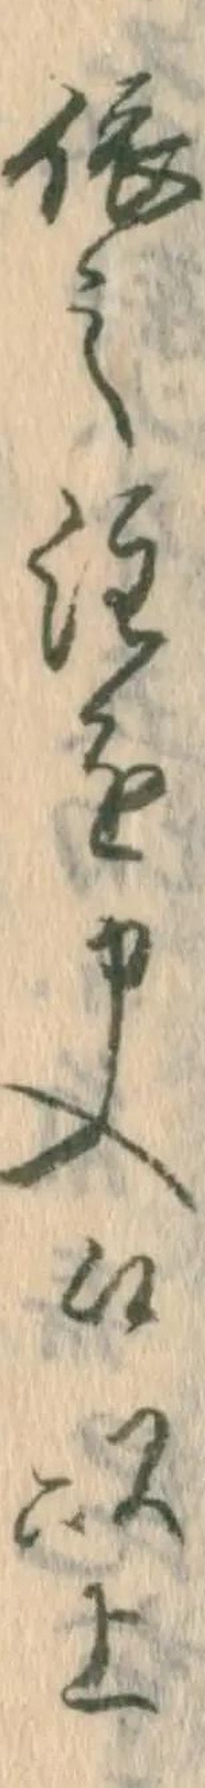依之注進申入候以上
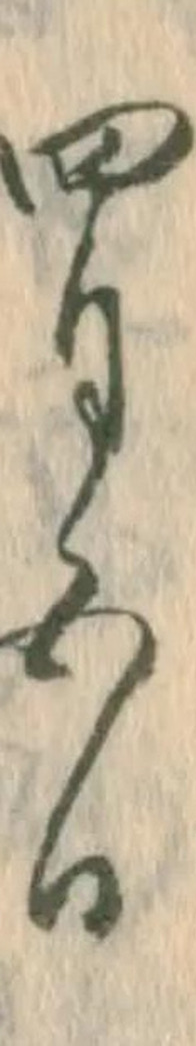四月五日
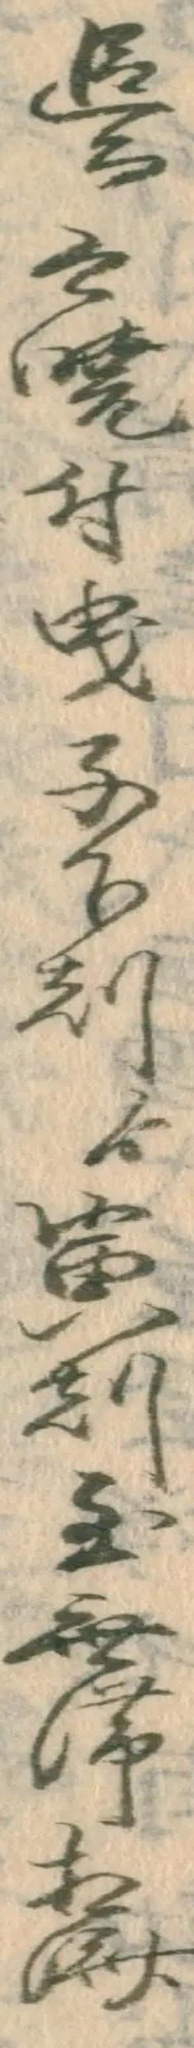追而今暁付曳子下刻ゟ寅刻至無滞相済
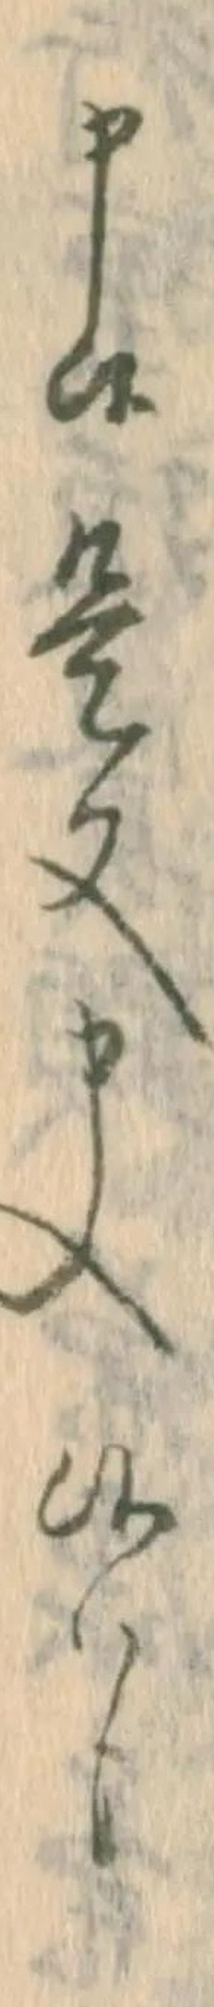申候是又申入候以上
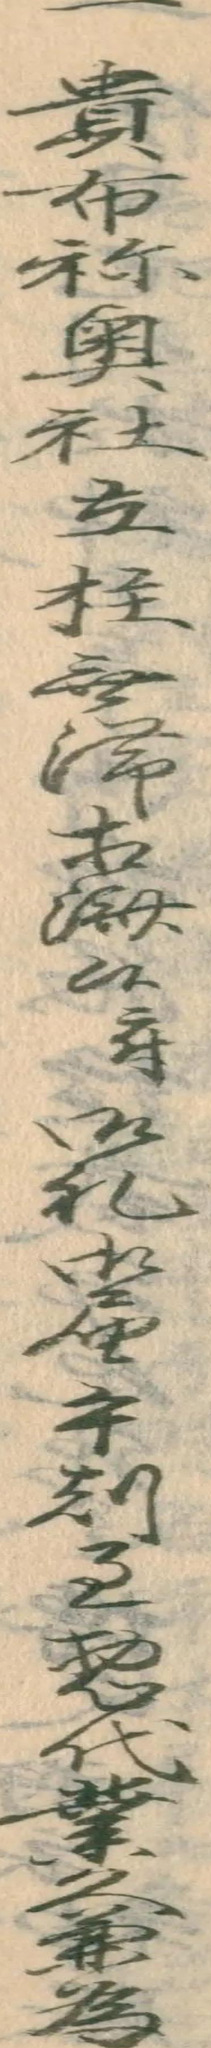一貴布祢奥社立柱無滞相済候ニ付御礼御届午刻過惣代業久兼為
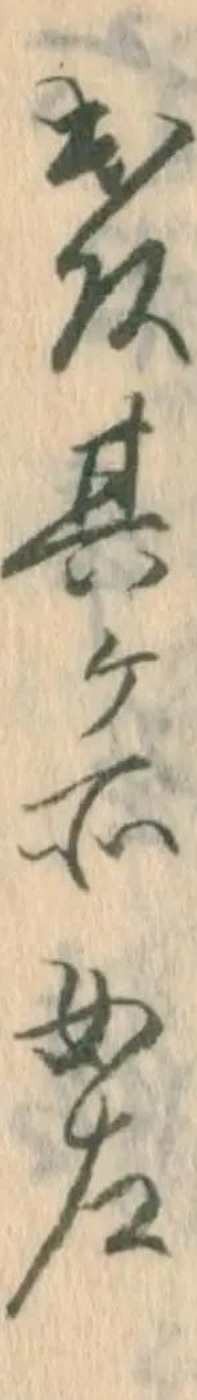出頭其ケ所如左
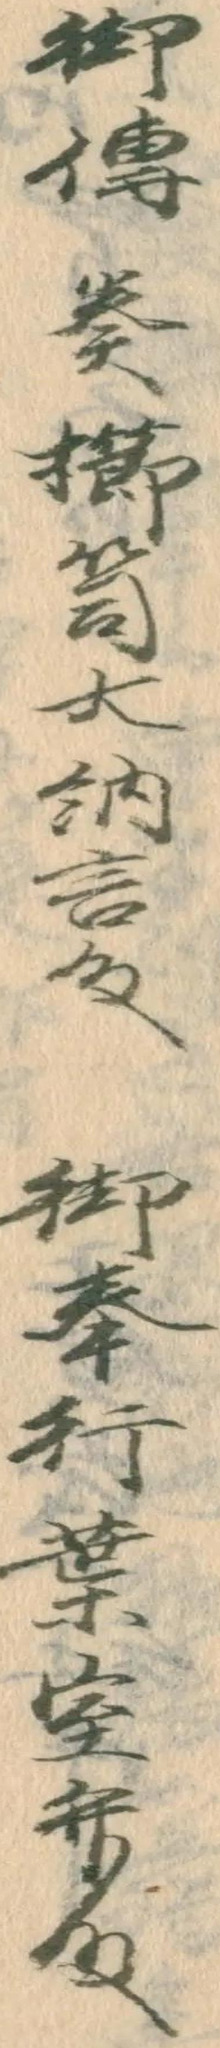御伝奏櫛笥大納言殿御奉行葉室弁殿
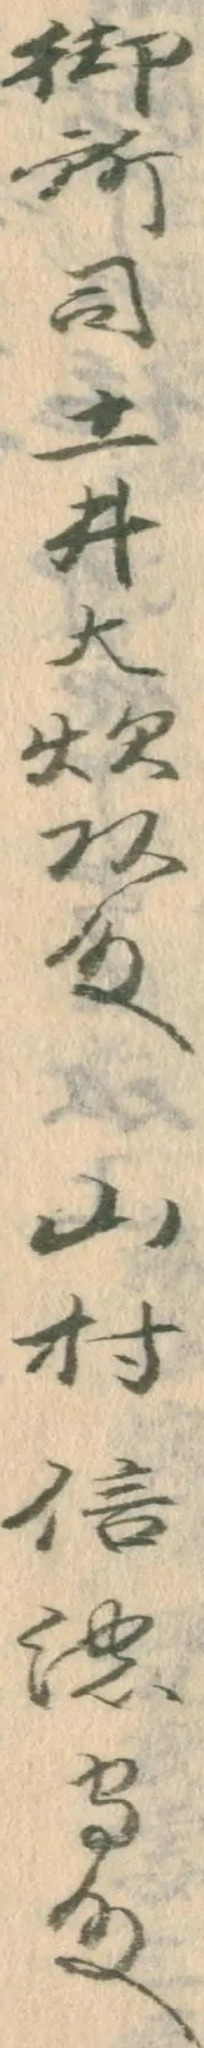御所司土井大炊頭殿山村信濃守殿
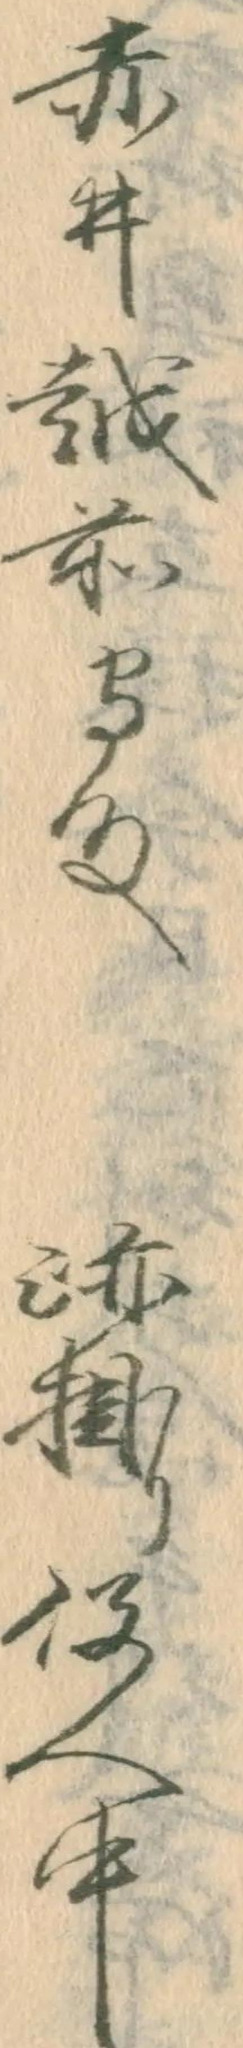赤井越前守殿跡掛り役人中
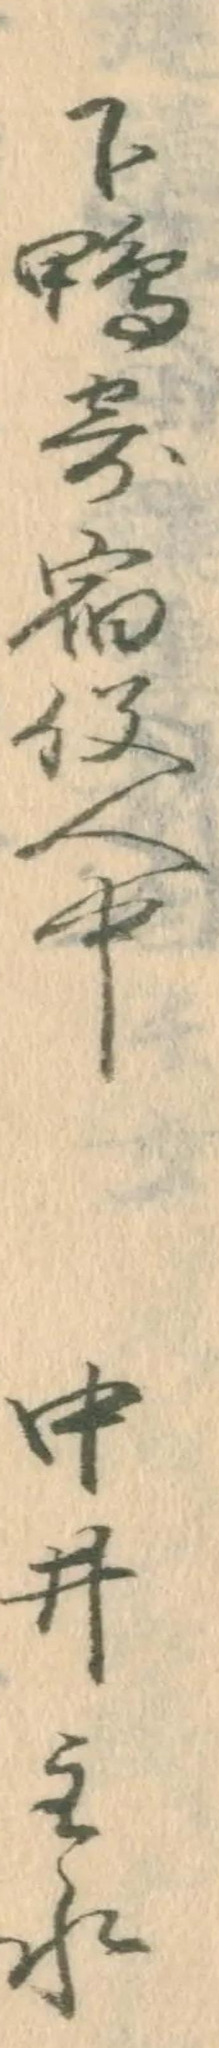下鴨寄宿役人中中井主水
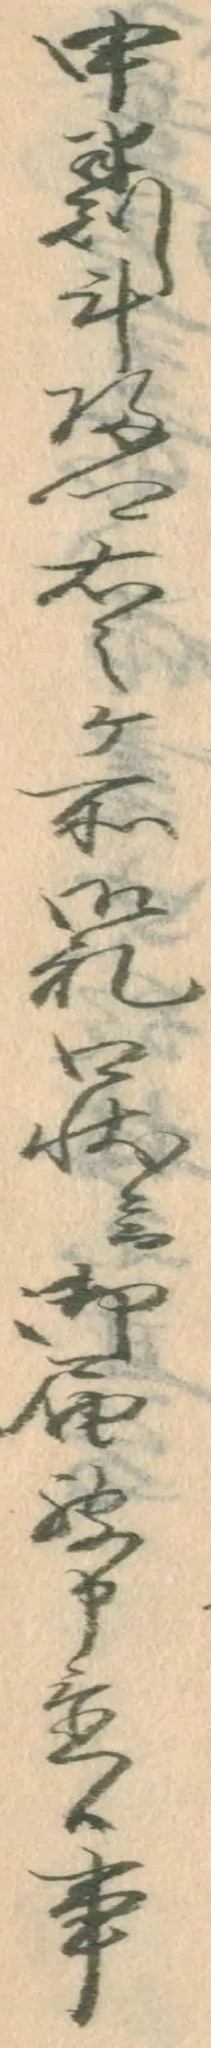申半刻計帰郷右之ケ所御札口状ニ而御届被申置候事

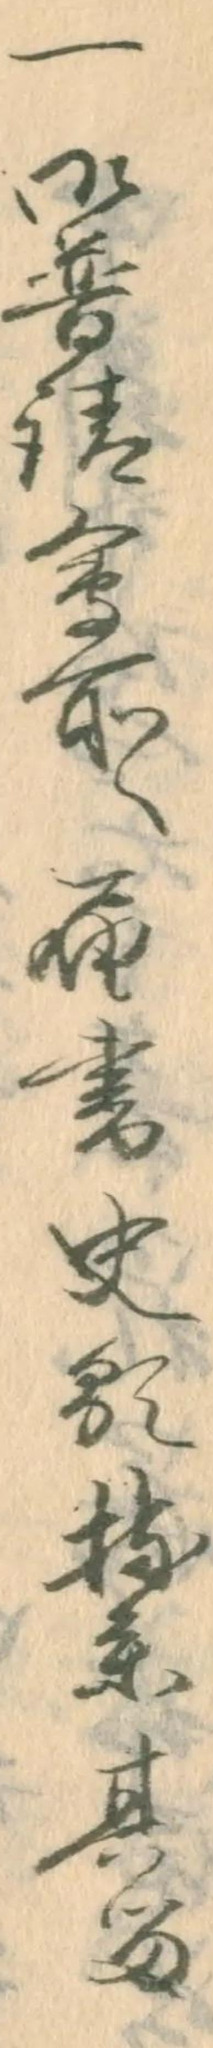一御普請会所へ届書史顕持参其留
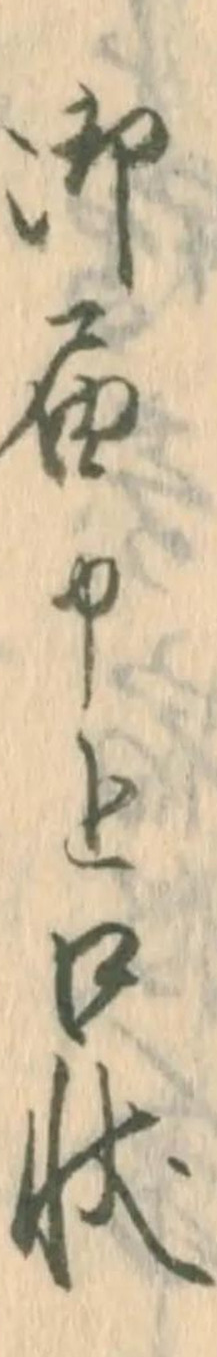御届申上口状
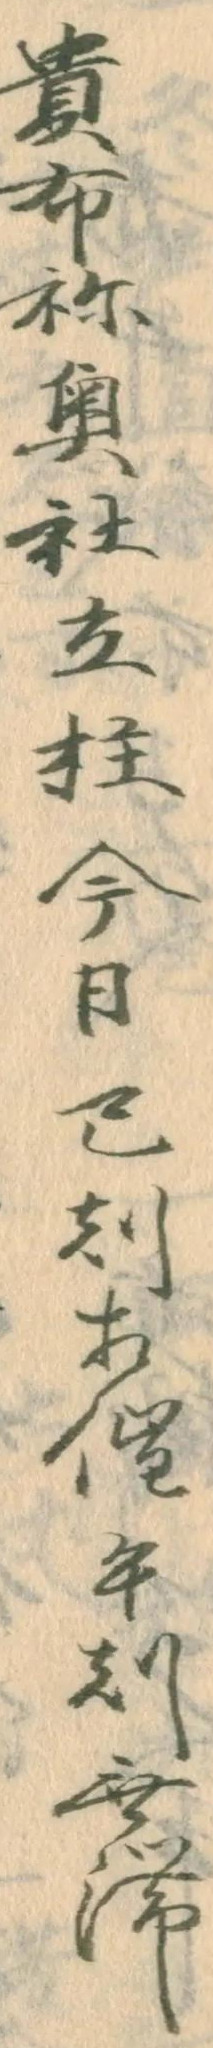貴布祢奥社立柱今日巳刻相催午刻無滞
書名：賀茂社記録. 第17冊
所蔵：国立国会図書館 National Diet Library, JAPAN
